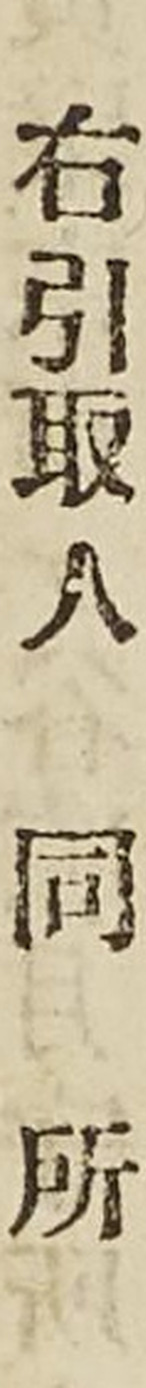右引取人同同
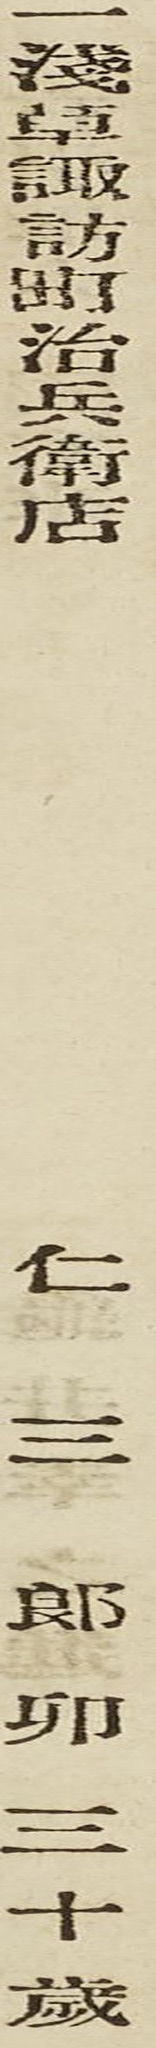一浅草諏訪町治兵衛店仁三郎卯三十歳
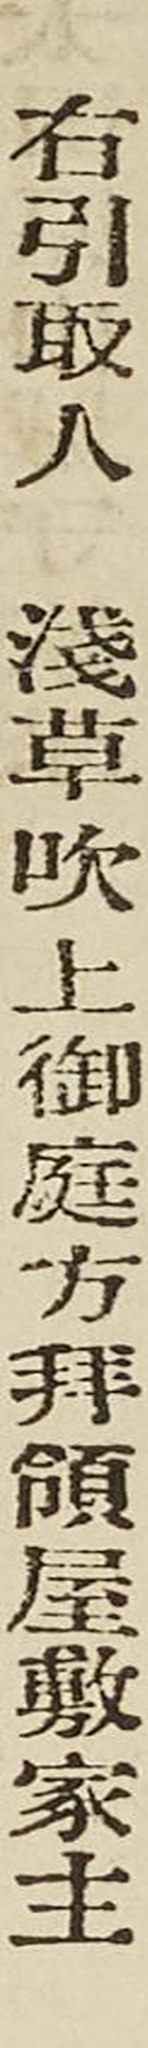右引取人浅草吹上御庭方拝領屋敷家主三平
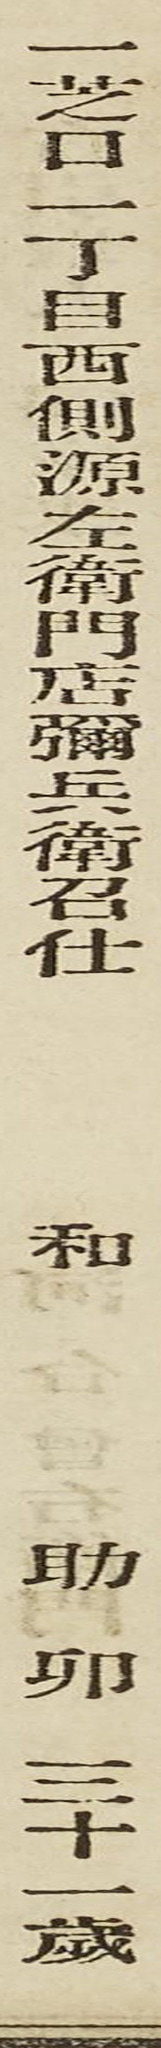一芝口一丁目西側源左衛門店彌兵衛召仕和助卯三十一歳
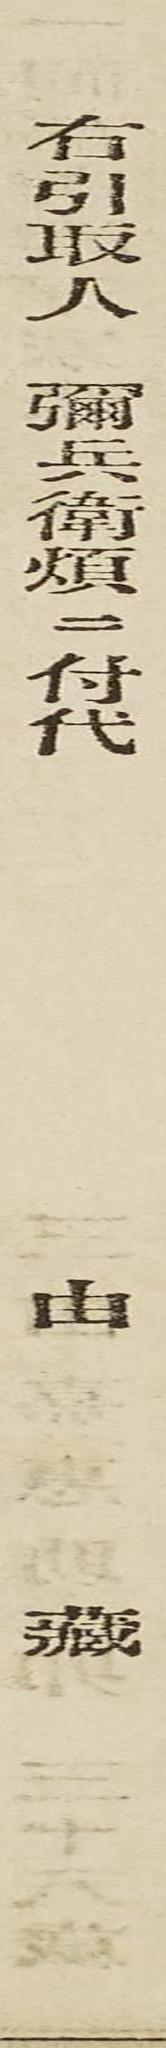右引取人彌兵衛煩ニ付代由蔵
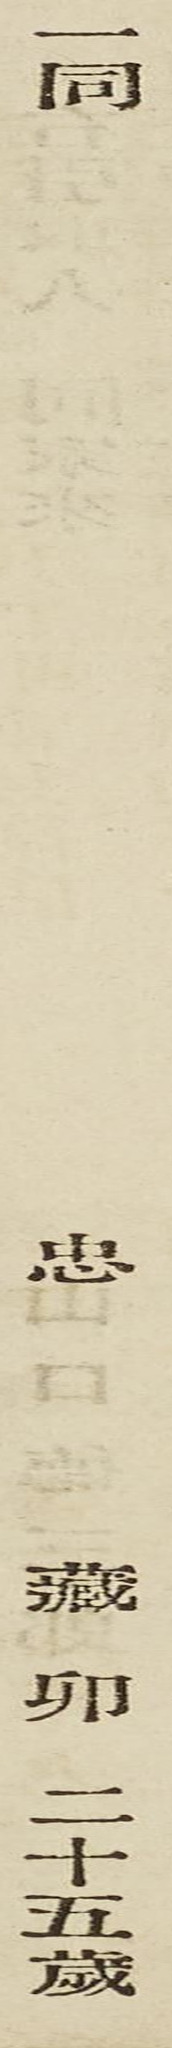一同忠蔵卯二十五歳
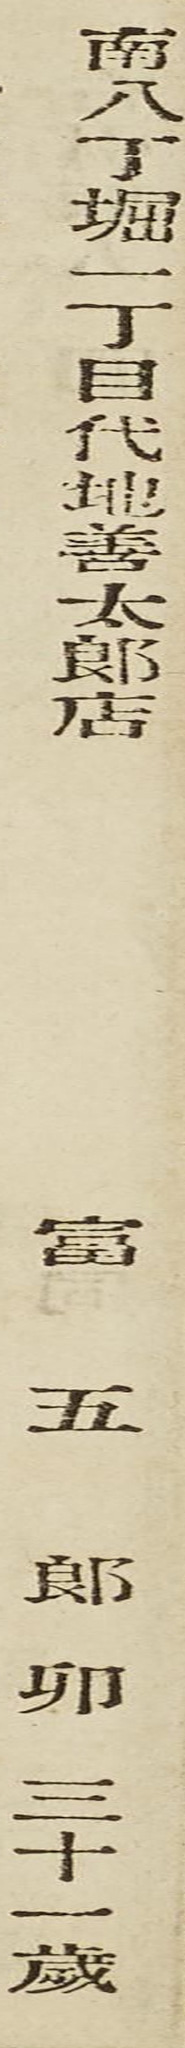一南八丁堀一丁目代地善太郎店冨五郎卯三十一歳
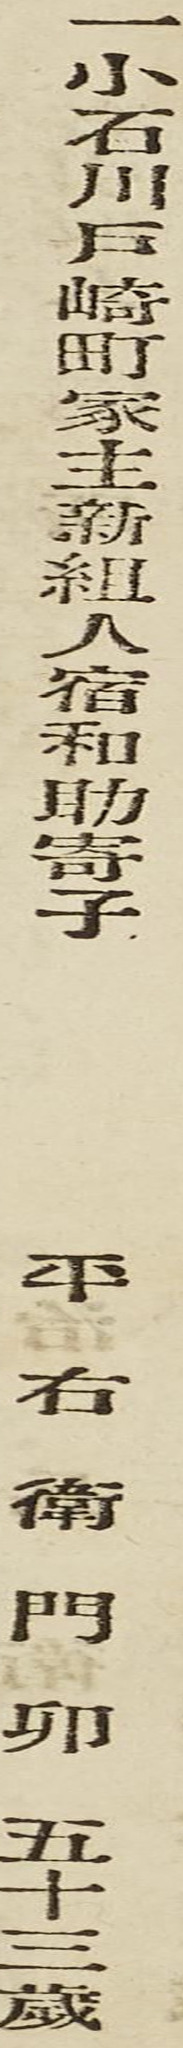一小石川戸崎町家主新組人宿和助寄子平右衛門卯五十三歳
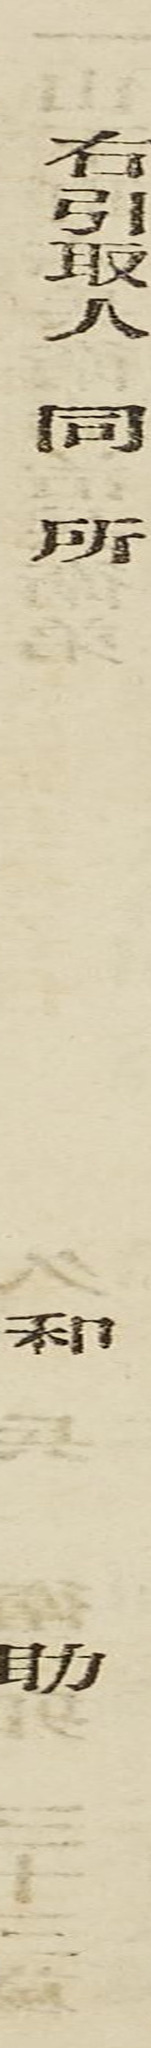右引取人同所和助
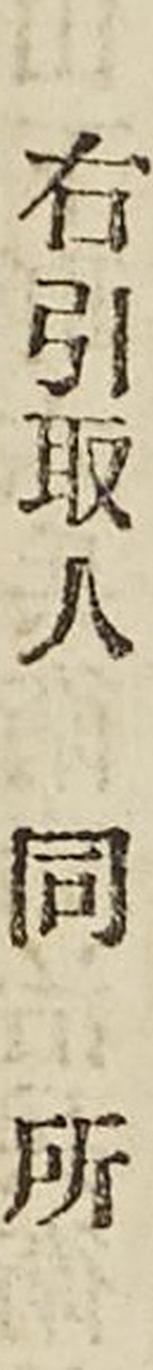右引取人同同
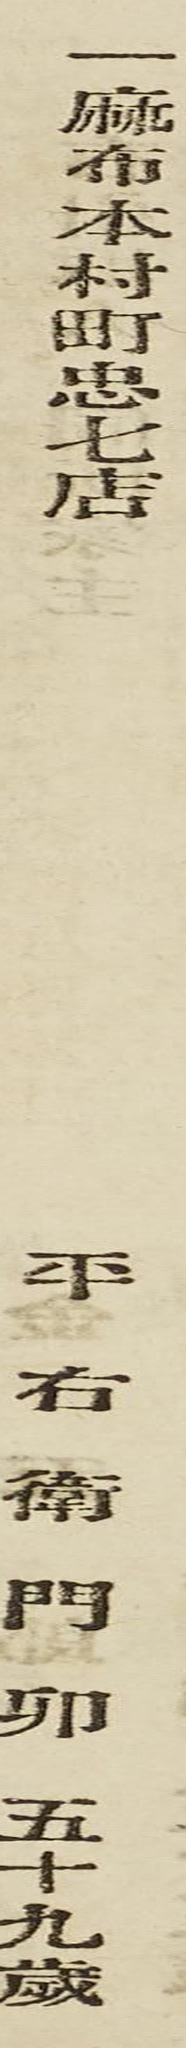一麻布本村町忠七店平右衛門卯五十九歳
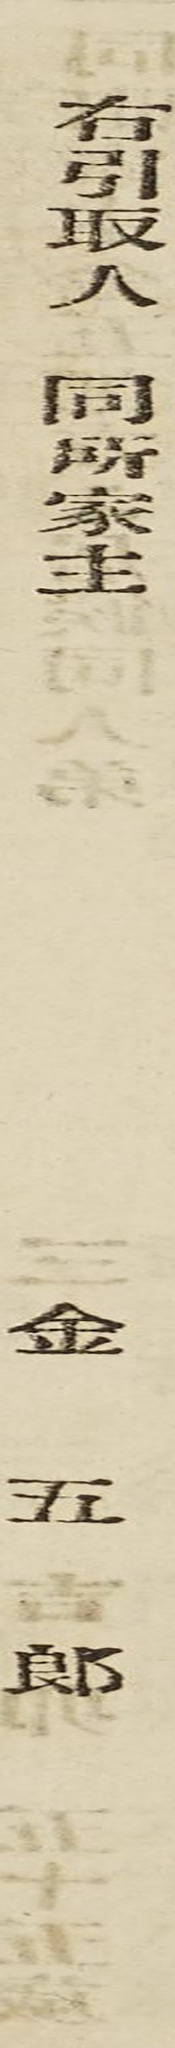右引取人同所家主金五郎
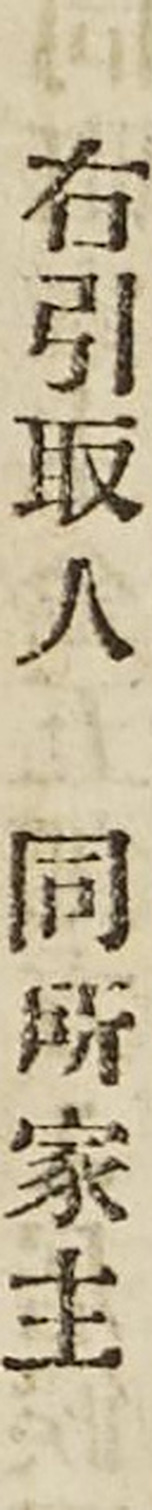右引取人同所伊助
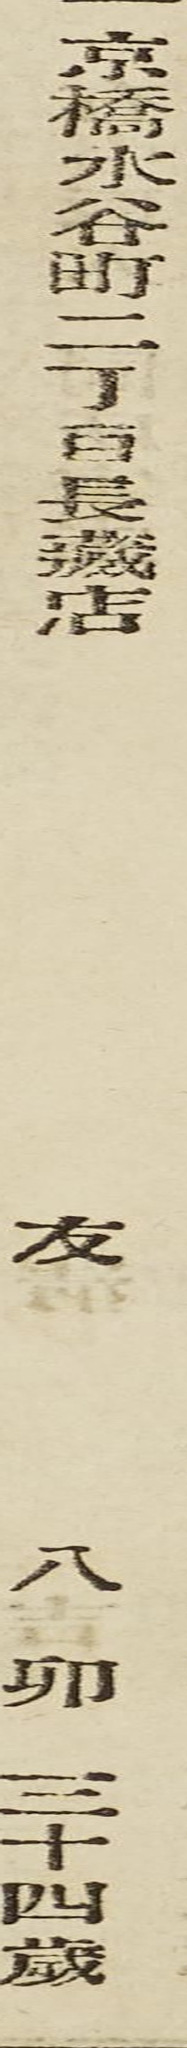一京橋水谷町二丁目長蔵店友八卯三十四歳
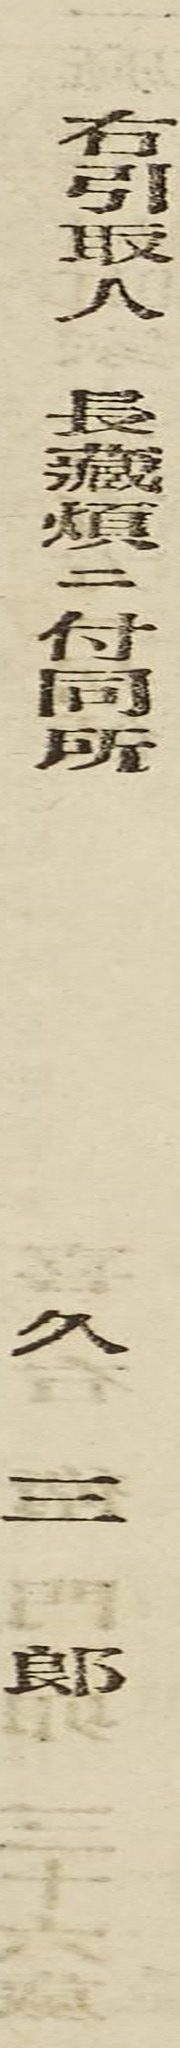右引取人長蔵煩ニ付同所久三郎
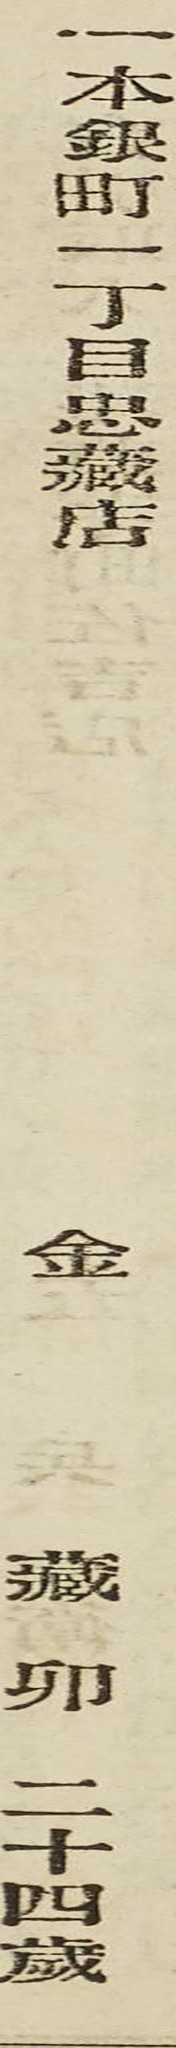一本銀町一丁目忠蔵店金蔵卯二十四歳
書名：永代惨話　文化の夢　全
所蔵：東京大学地震研究所図書室 Earthquake Research Institute Library, The University of Tokyo, JAPAN
